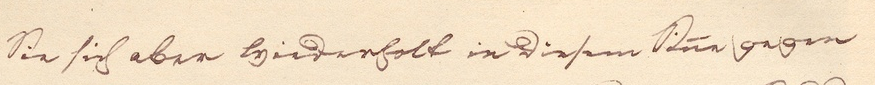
Sie sich aber wiederholt in diesem Sinne gegen
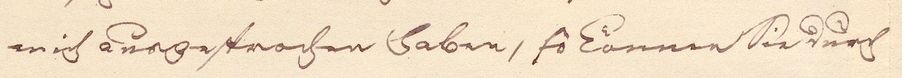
mich ausgesprochen haben, so können Sie durch
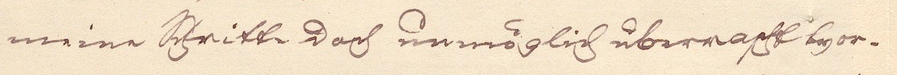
meine Schritte doch unmöglich überrascht wor-
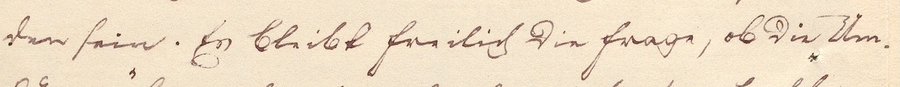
den sein. Es bleibt freilich die Frage, ob die Um-
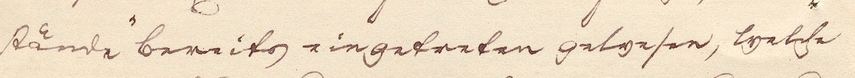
stände bereits eingetreten gewesen, welche
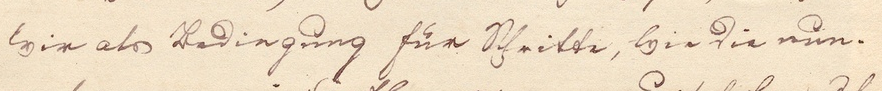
wir als Bedingung für Schritte, wie die nun-
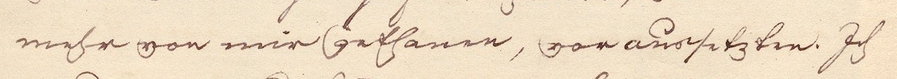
mehr von mir gethanen, voraussetzten. Ich
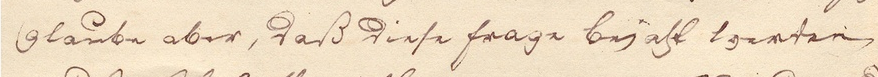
glaube aber, daß diese Frage bejaht werden
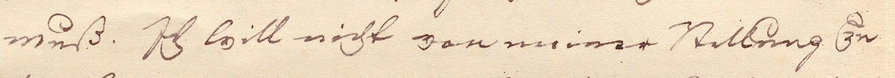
muß. Ich will nicht von meiner Stellung zu
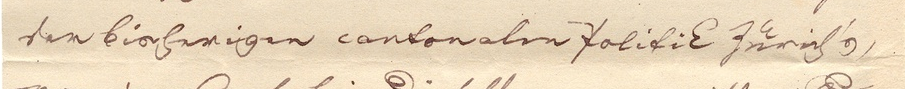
der bisherigen cantonalen Politik Zürich's,
